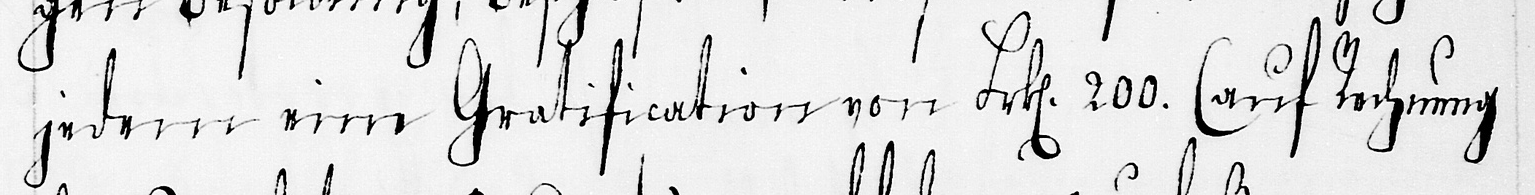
jedem eine Gratification von Frk[en]. 200. (auf Rechnung
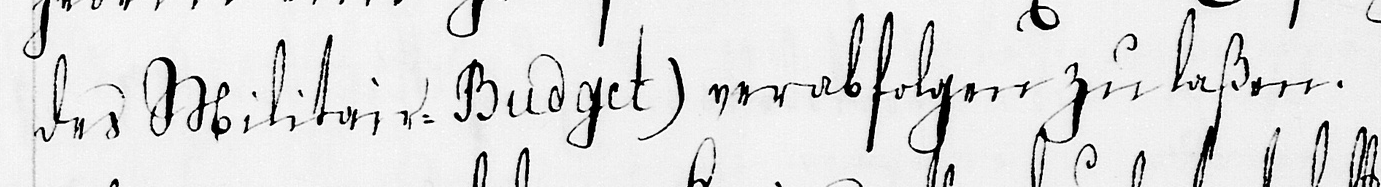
des Militair-Budget) verabfolgen zu laßen.
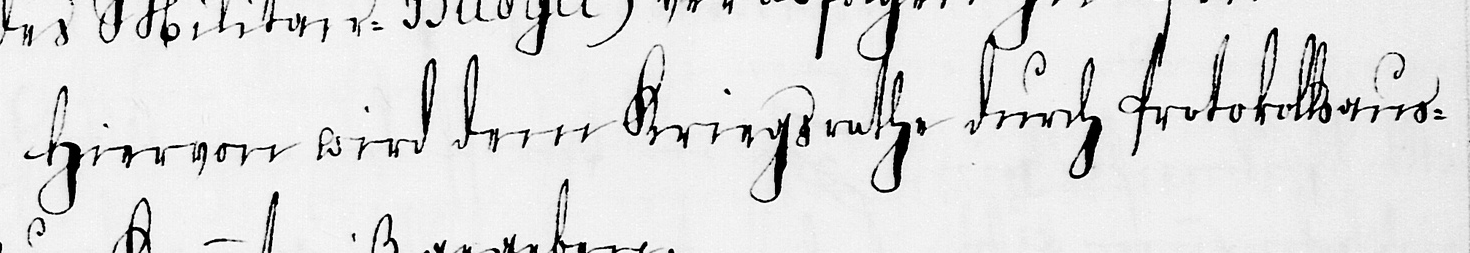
Hiervon wird dem Kriegsrathe durch Protokollsaus¬
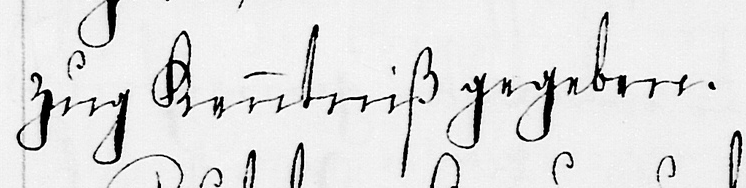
zug Kenntniß gegeben.
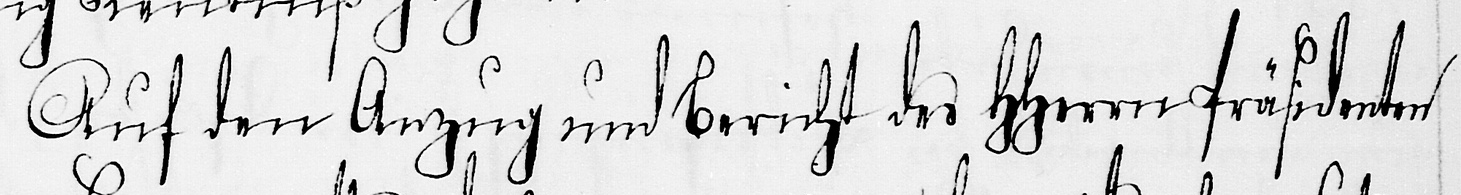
Auf den Anzug und Bericht des HHerrn Präsiden¬
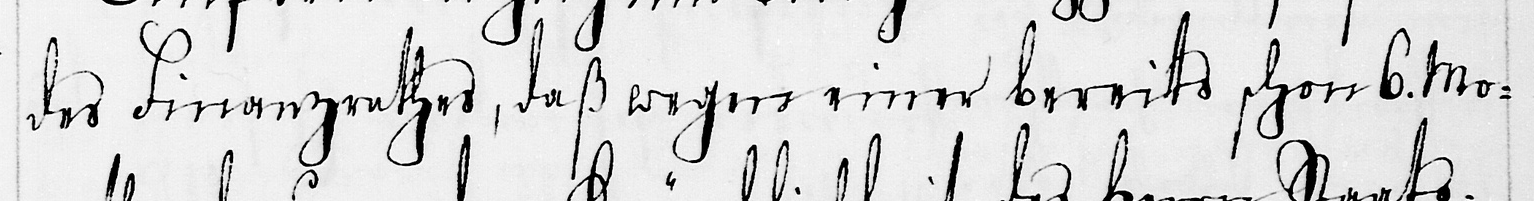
des Finanzrathes, daß wegen einer bereits schon 6. Mo¬
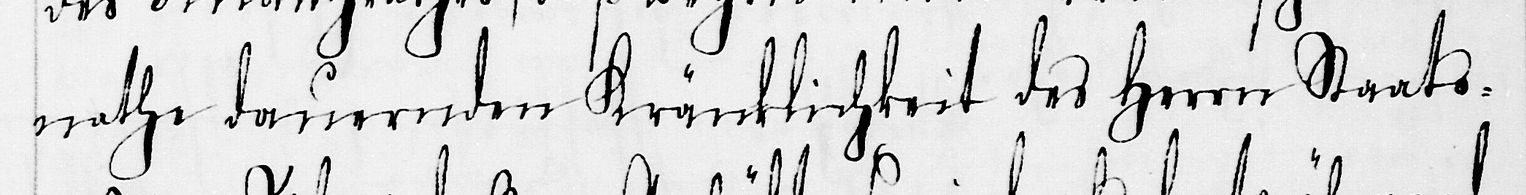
nathe dauernden Kränklichkeit des Herrn Staats¬
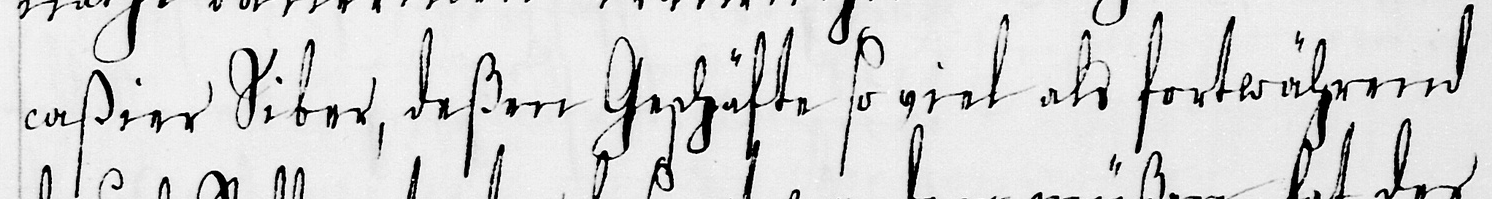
caßier Siber, deßen Geschäfte so viel als fortwährend
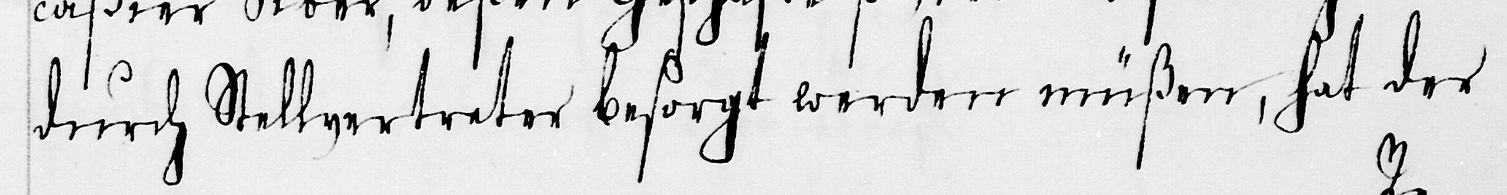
durch Stellvertreter besorgt werden müßen, hat der
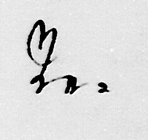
ten
